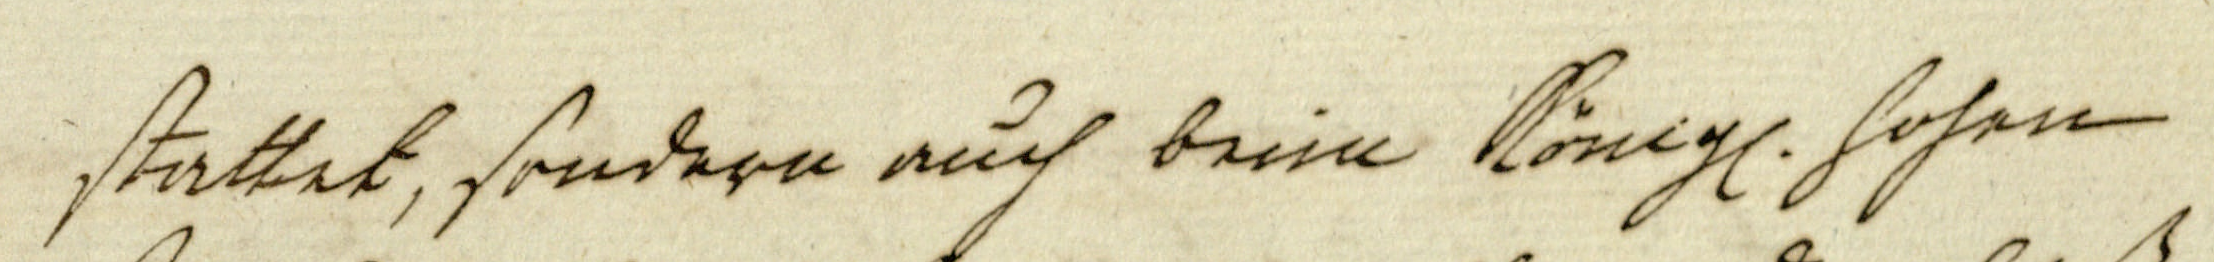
stattet, sondern auch beim Königl. hohen
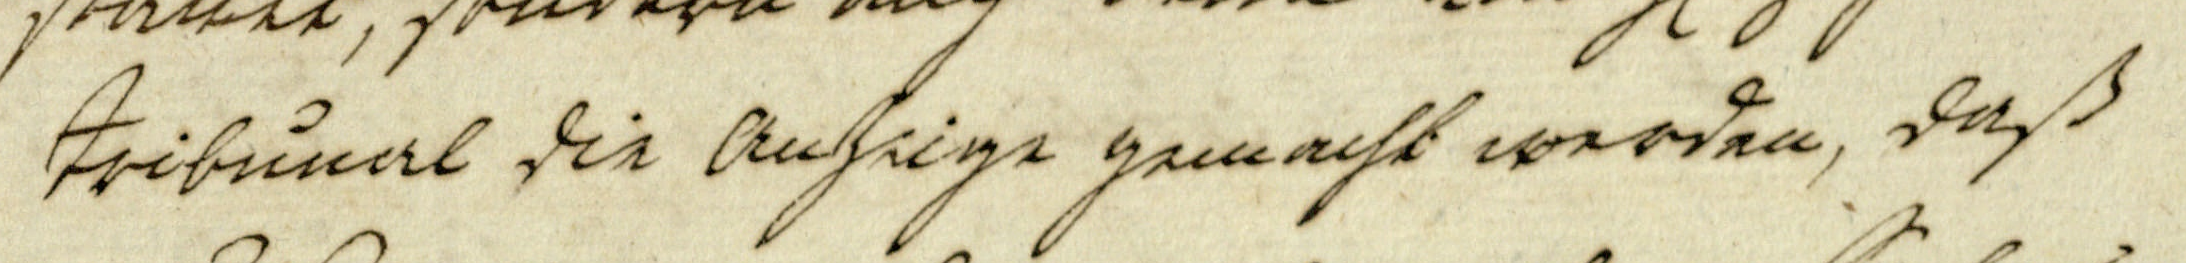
Tribunal die Anzeige gemacht werden, daß
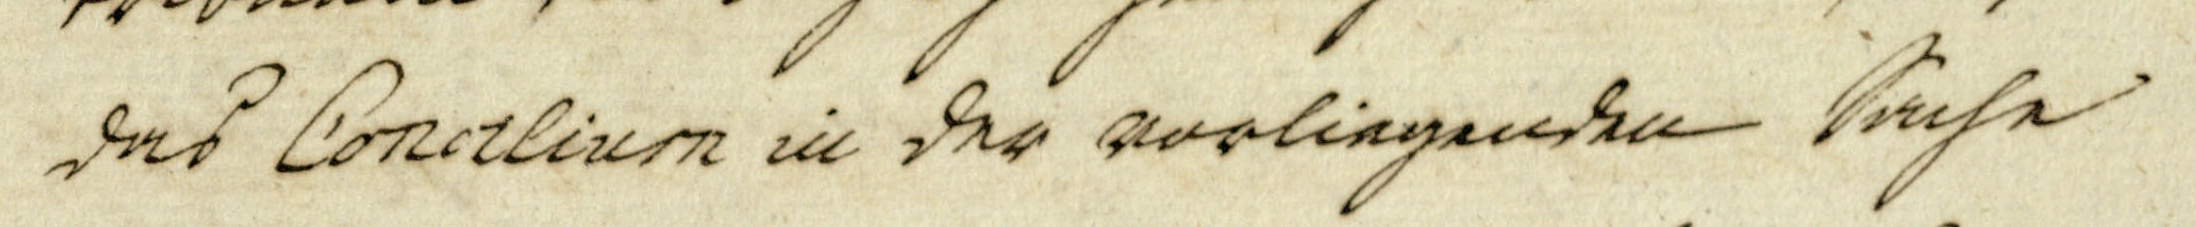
das Concilium in der vorliegenden Sache
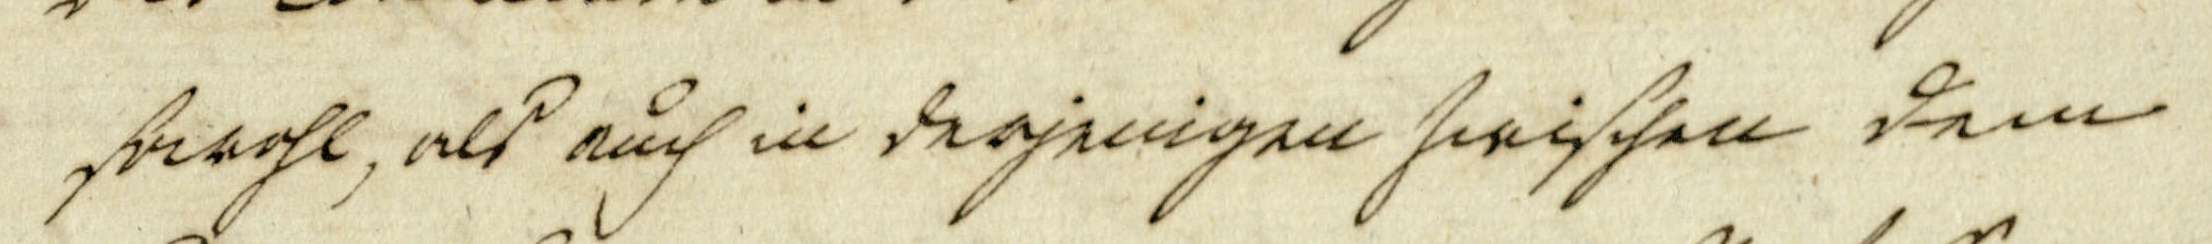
sowohl, als auch in derjenigen zwischen dem
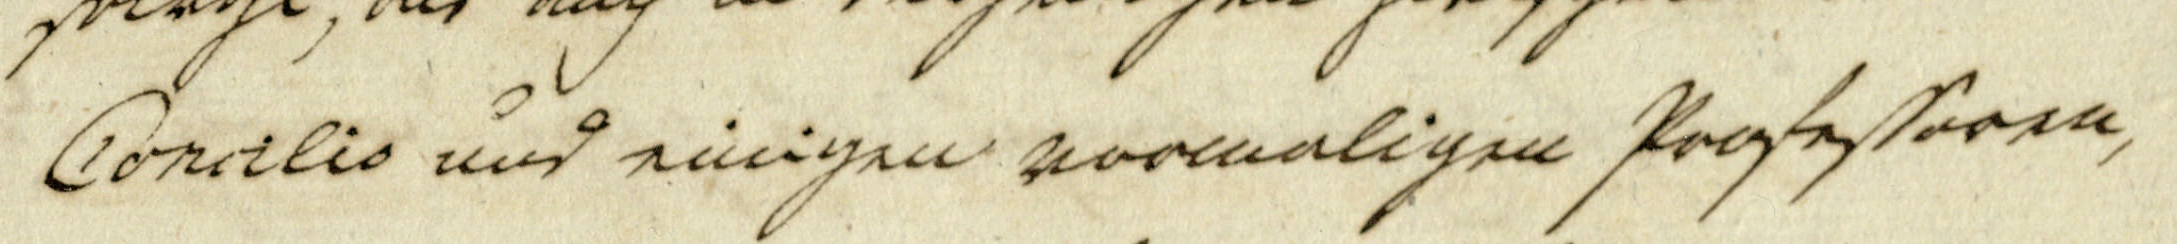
Concilio und einigen vormaligen Professoren,
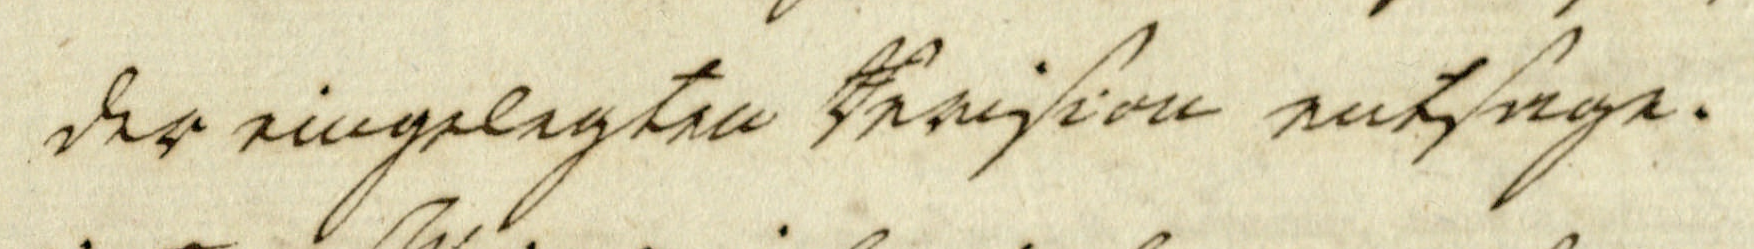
der eingelegten Revision entsage.
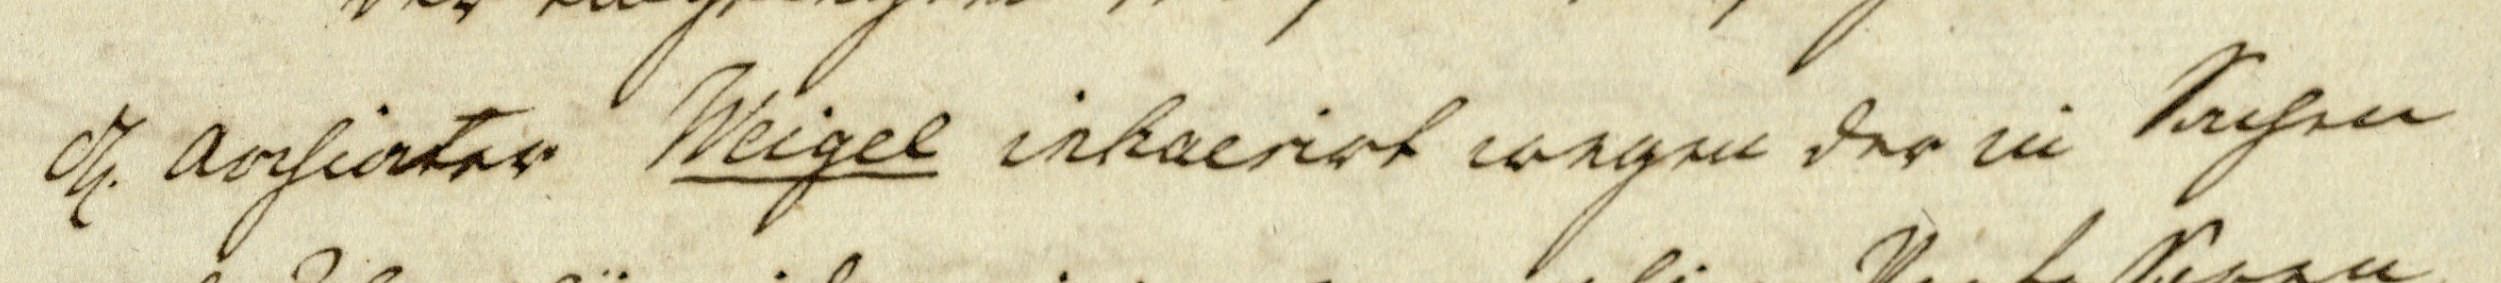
dh. Archiater Weigel inhaerirt wegen der in Sachen
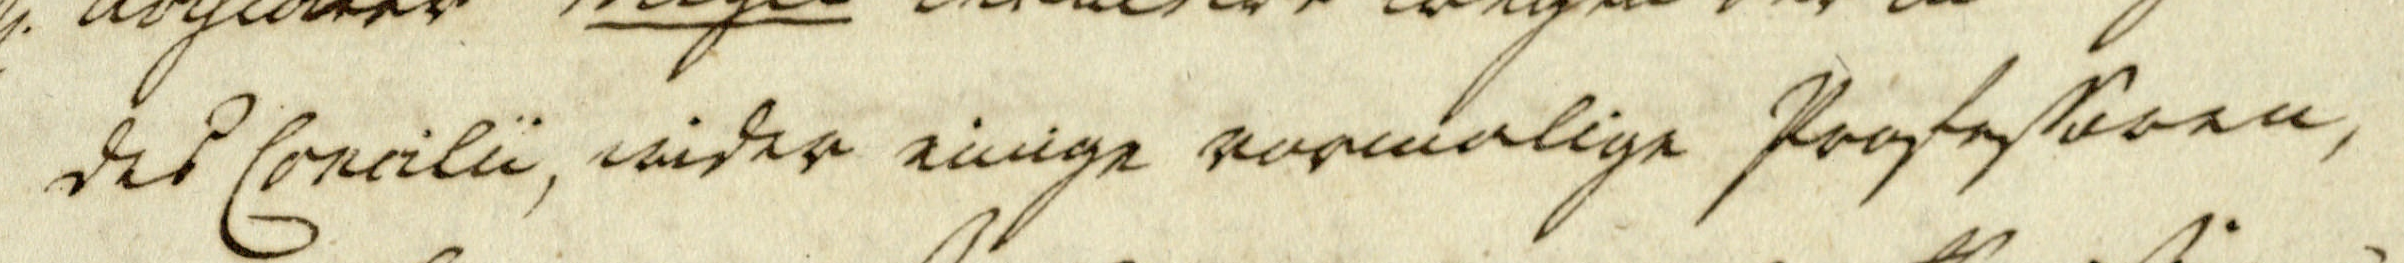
des Concilii, wider einige vormalige Professoren,
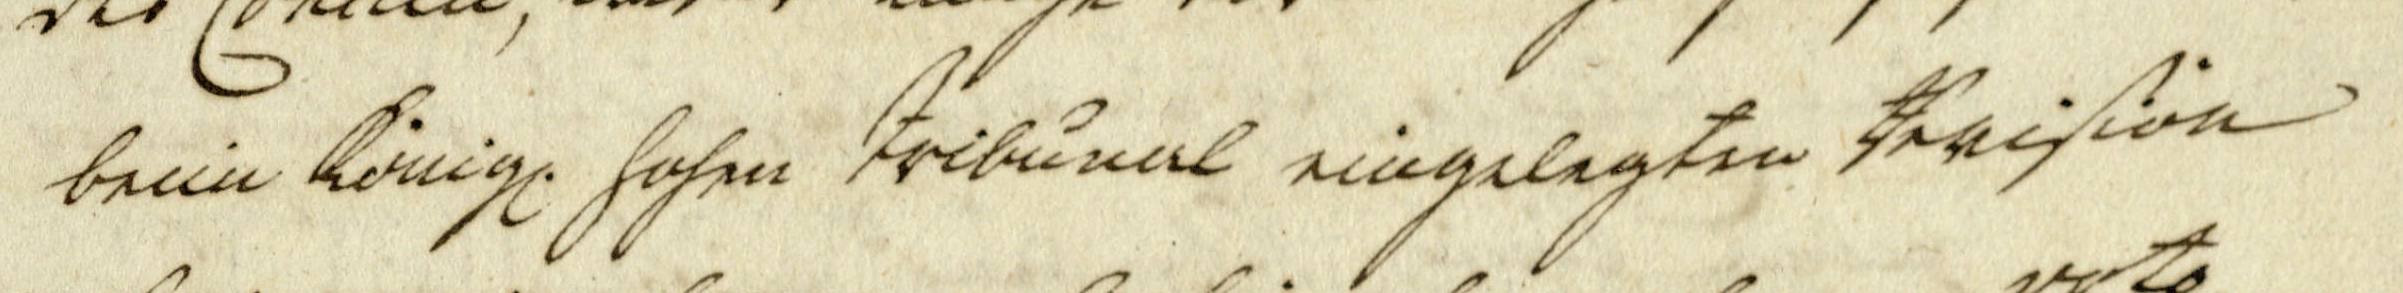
beim Königl. hohen Tribunal eingelegten Revision
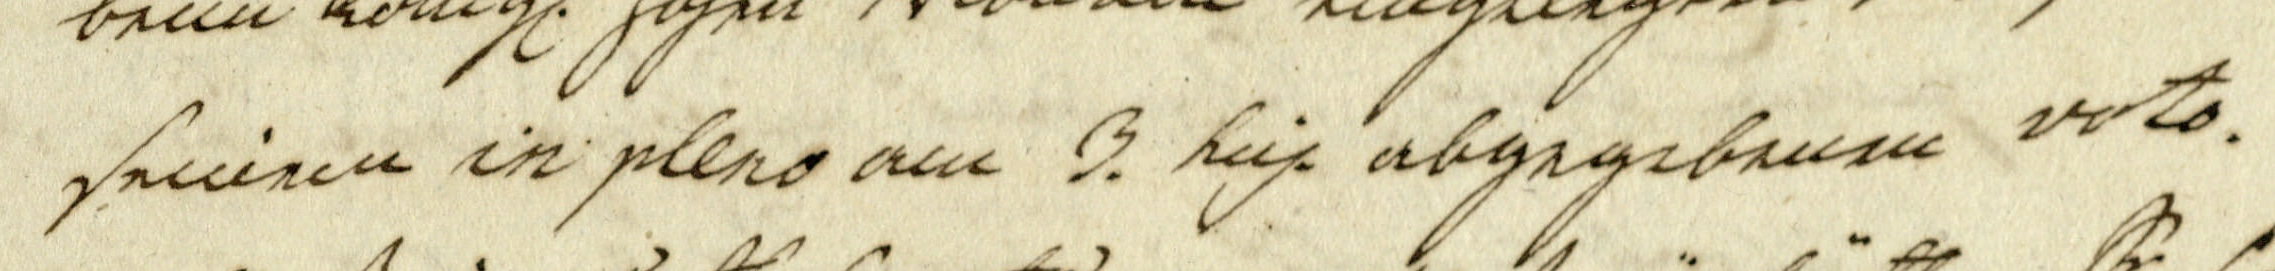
seinem in pleno am 3. huj. abgegebenen voto.
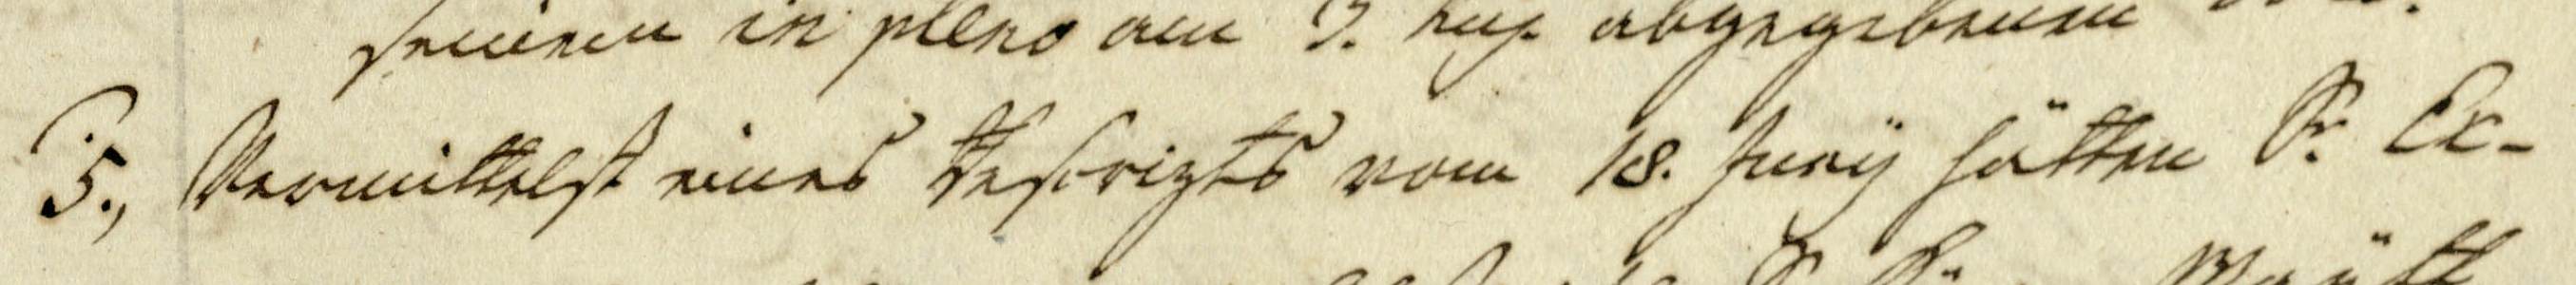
5., Vermittelst eines Rescripts vom 18. Junÿ hätten Sr. Ex¬
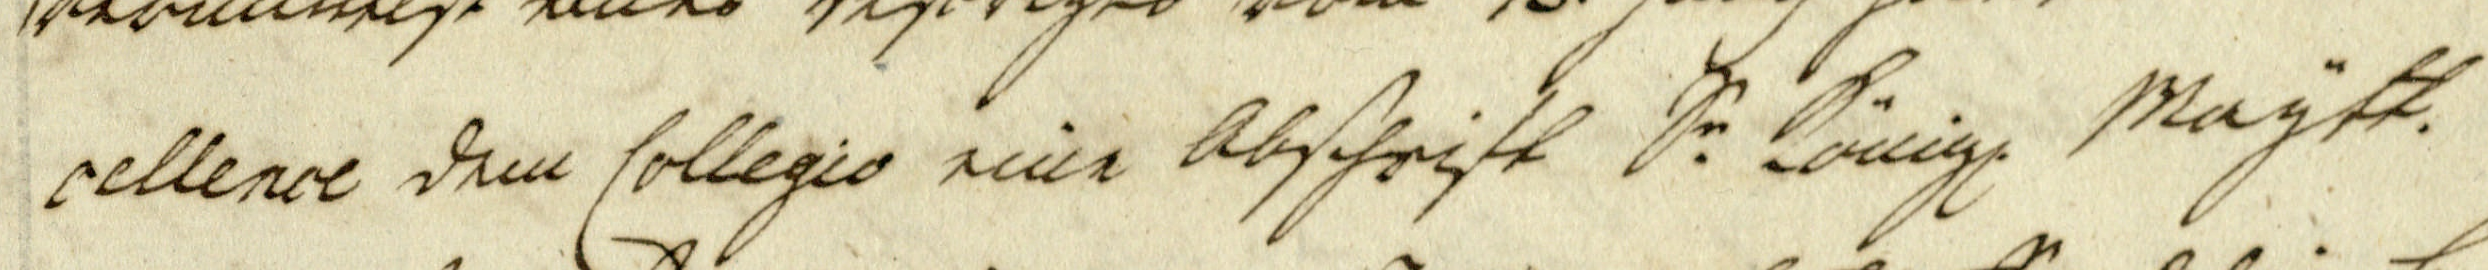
cellence dem Collegio eine Abschrift Sr. Königl. Maÿtt.
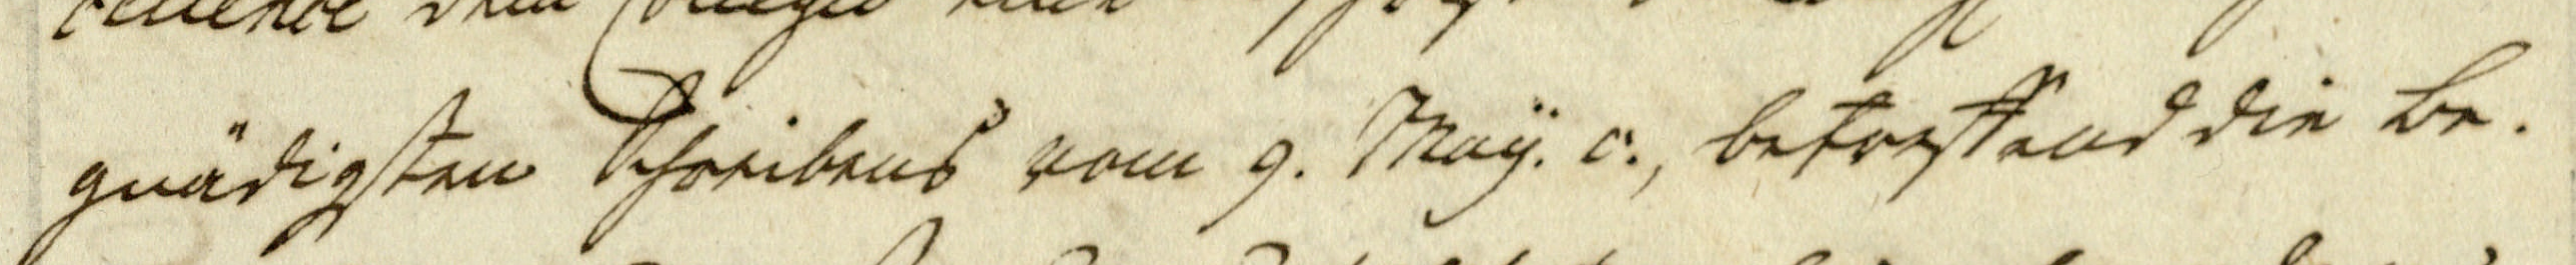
gnädigsten Schreibens vom 9. Maÿ. c., betreffend die Be¬
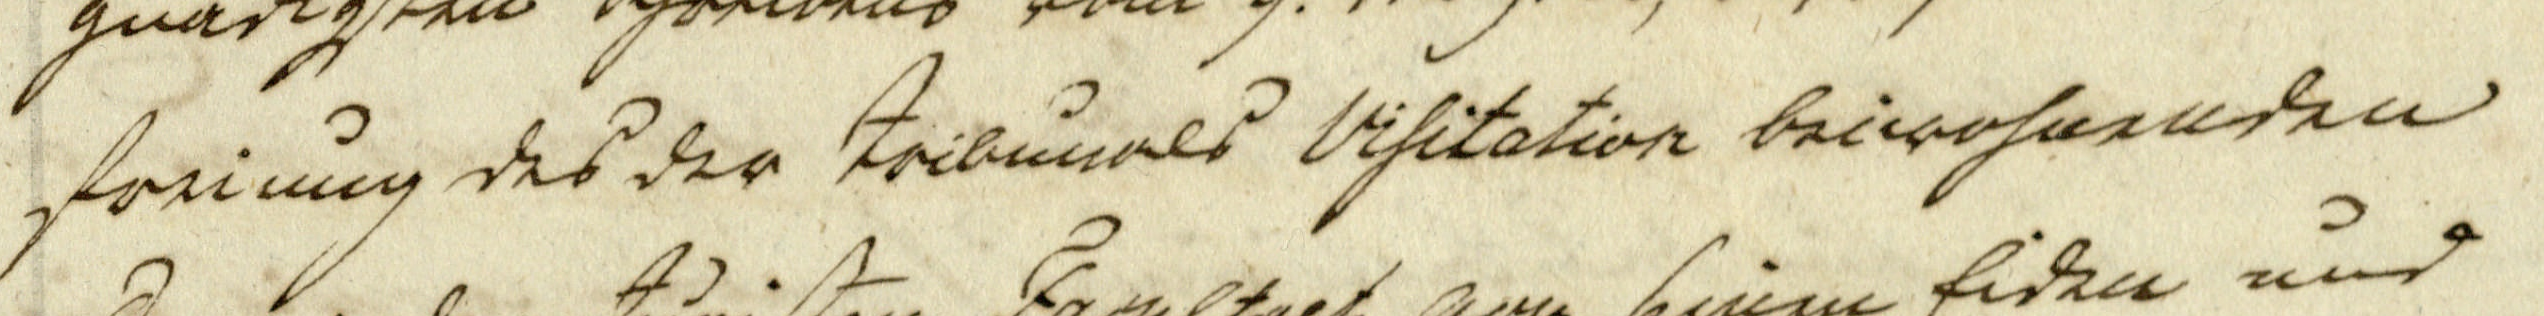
freiung des der Tribunals Visitation beiwohnenden
